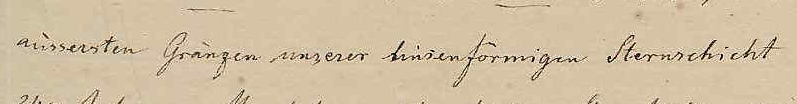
äussersten Gränzen unserer linsenförmigen Sternschicht
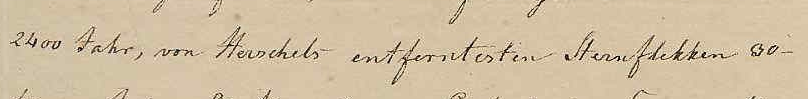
2400 Jahr, von Herschels entferntesten Sternflekken 30–
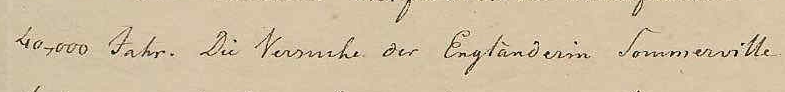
40,000 Jahr. Die Versuche der Engländerin Sommerville
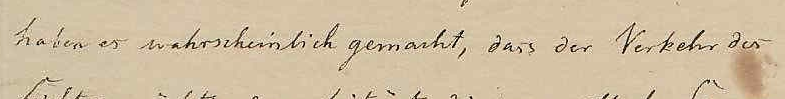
haben es wahrscheinlich gemacht, dass der Verkehr des
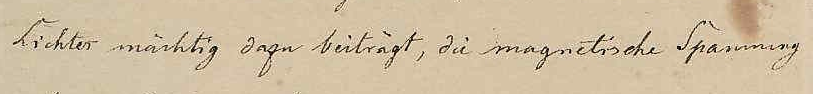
Lichtes mächtig dazu beiträgt, die magnetische Spannung
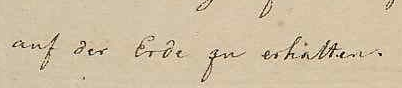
auf der Erde zu erhalten.
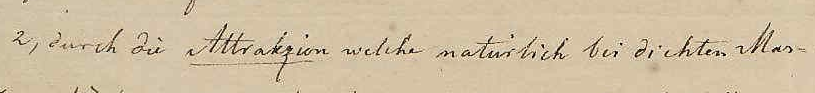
2, durch die Attrakzion welche natürlich bei dichten Mas-
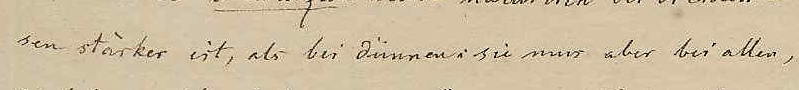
sen stärker ist, als bei dünnen: sie mus aber bei allen,
